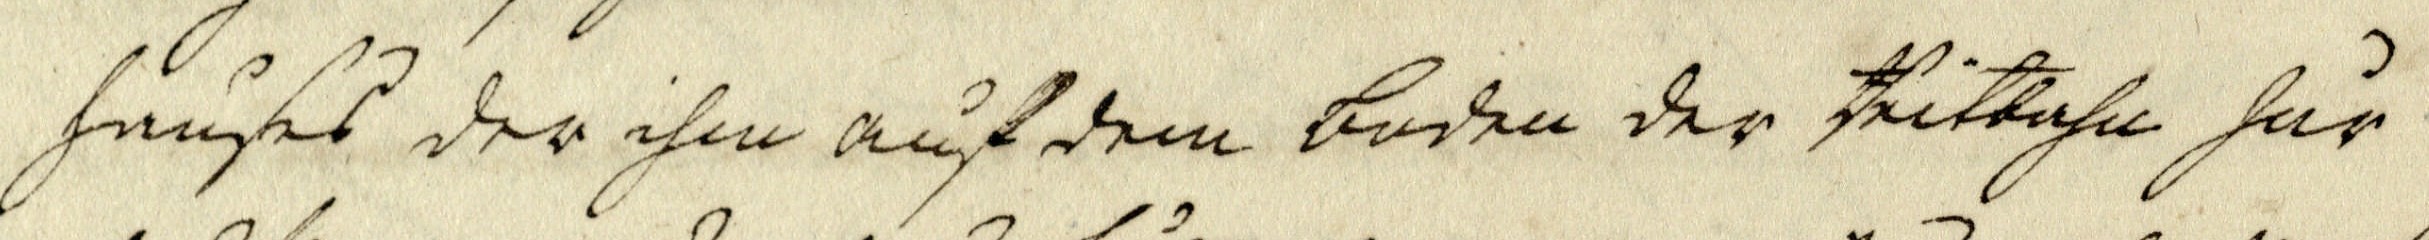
hauses der ihm auf dem Boden der Reitbahn zur
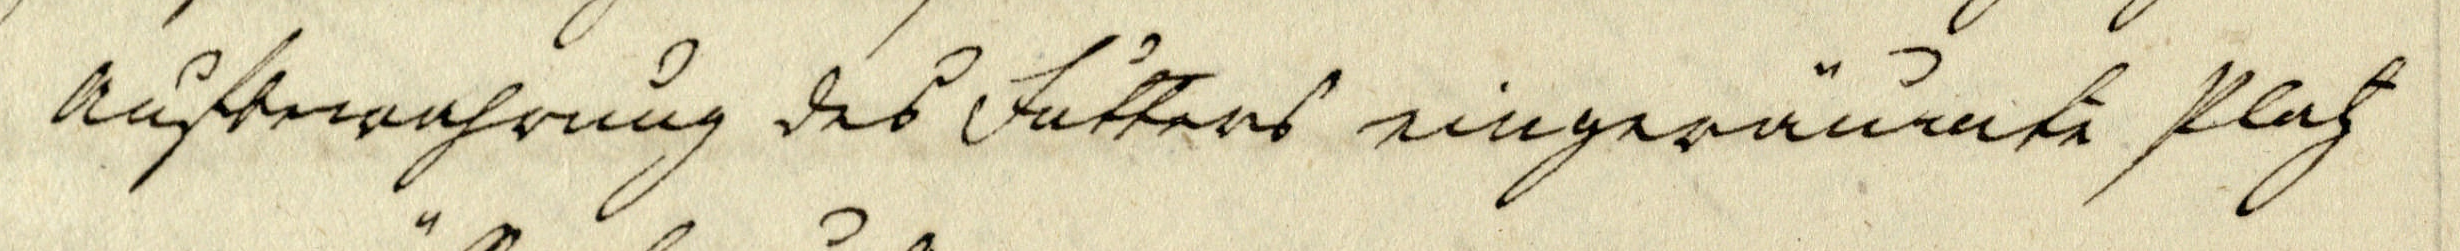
Aufbewahrung des Futters eingeräumte Platz
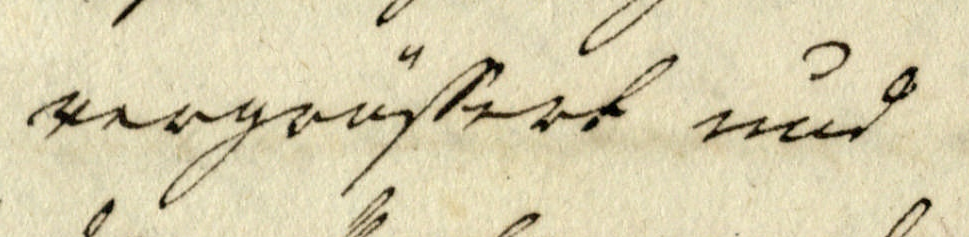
vergrössert und
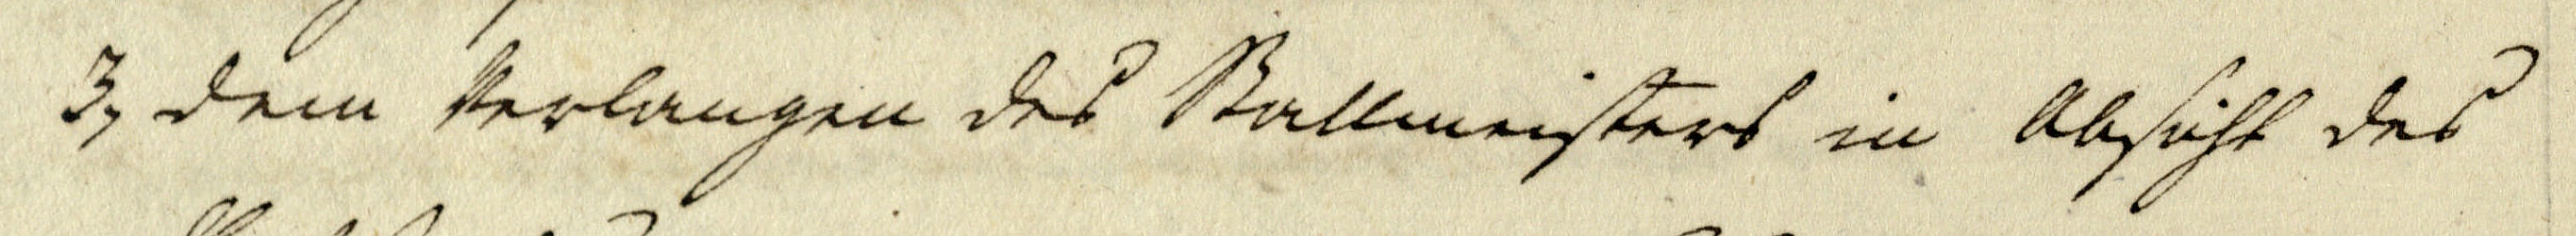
3., dem Verlangen des Stallmeisters in Absicht des
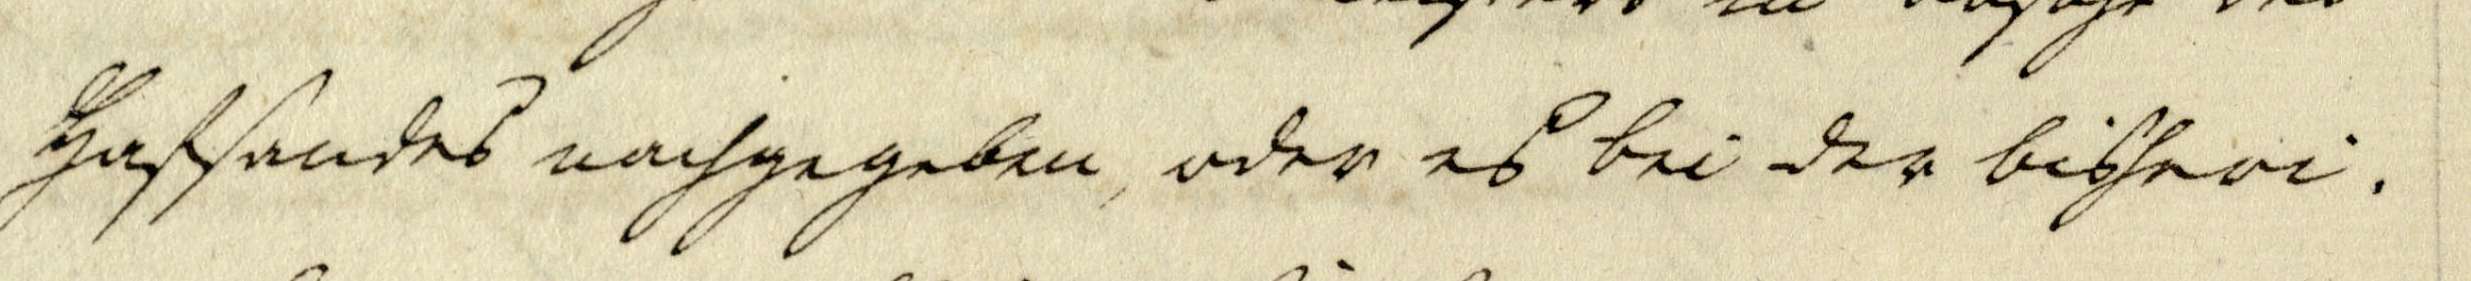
Hafsandes nachgegeben, oder es bei der bisheri¬
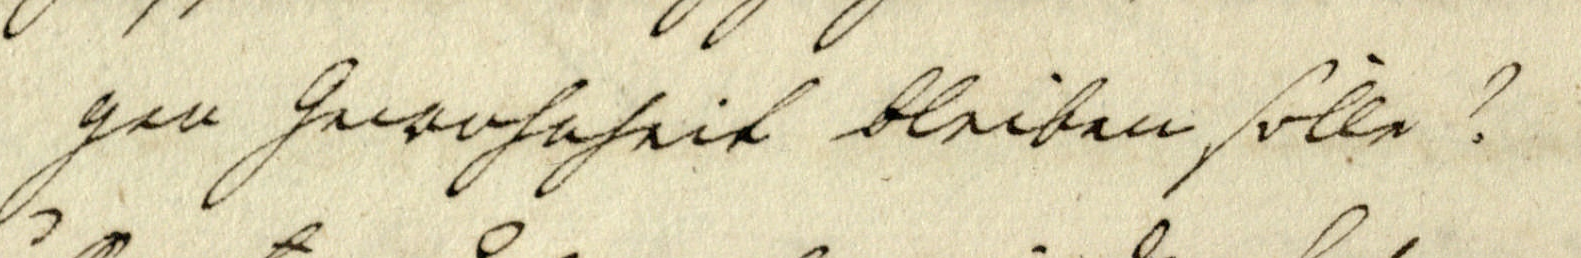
gen Gewohnheit bleiben solle?
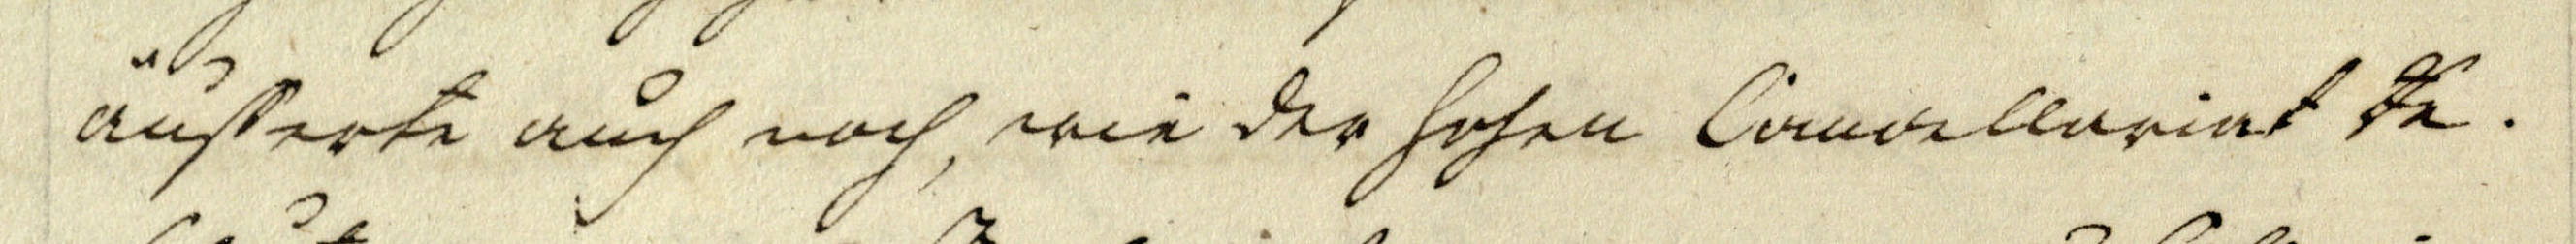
äusserte auch noch, wie der hohen Cancellariat Re¬
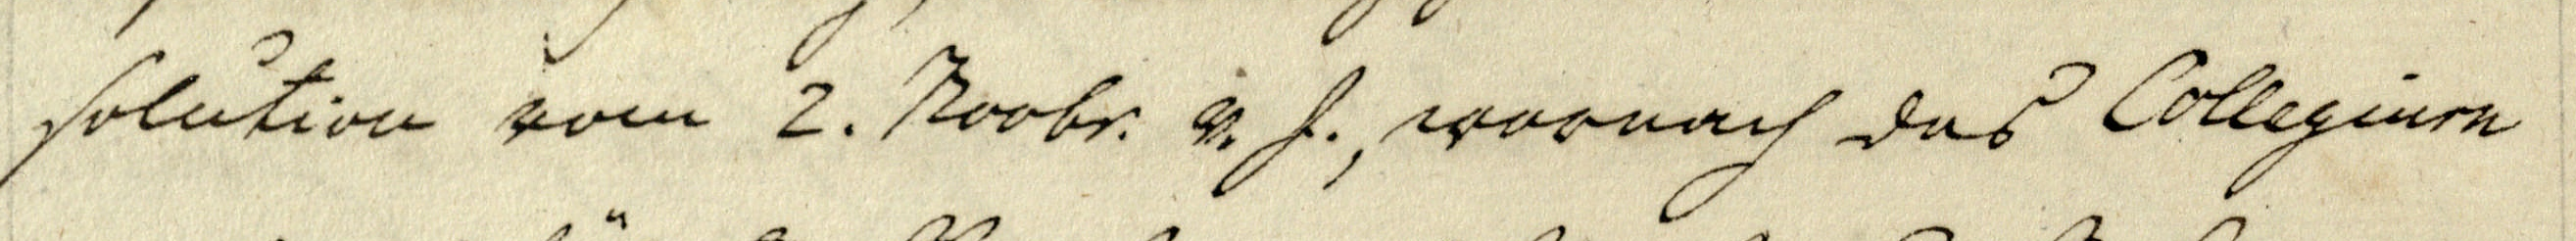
solution vom 2. Novbr. v. J., wornach das Collegium
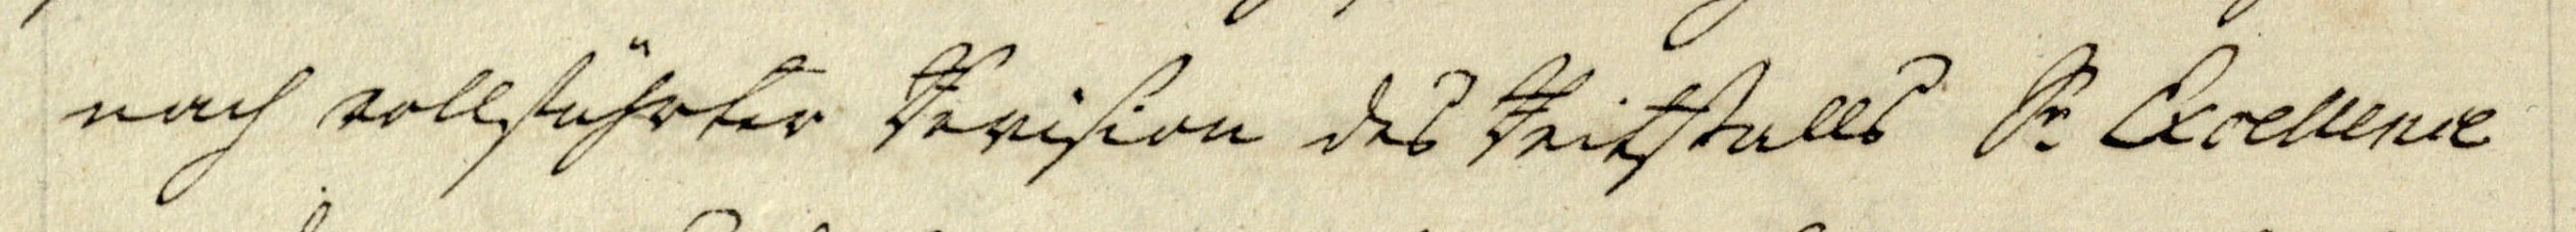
nach vollführter Revision des Reitstalls Sr Excellence
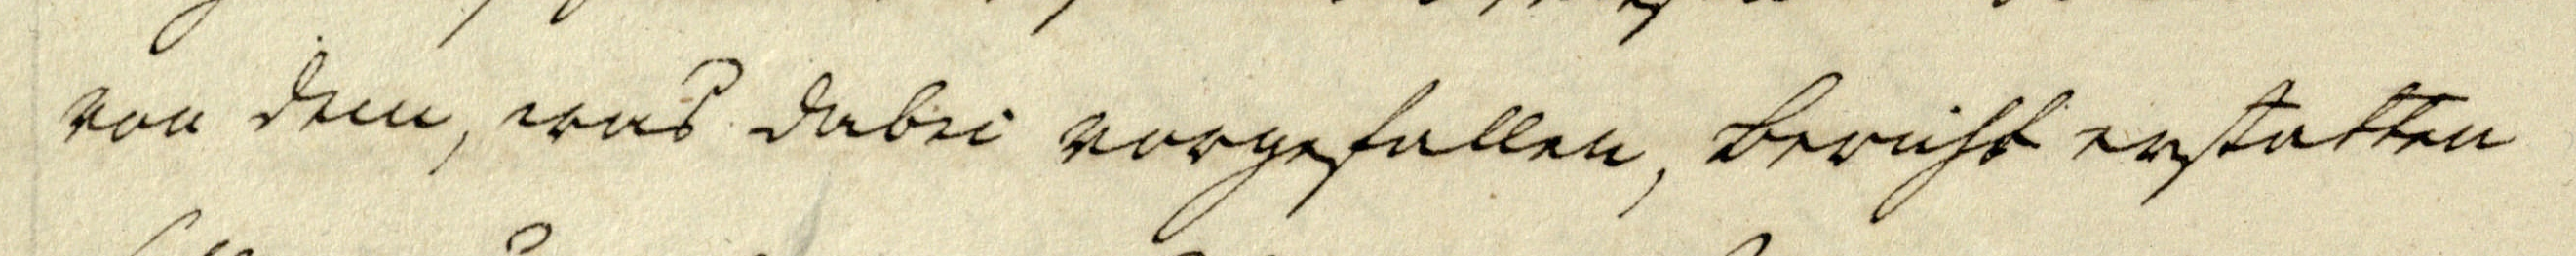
von dem, was dabei vorgefallen, Bericht erstatten
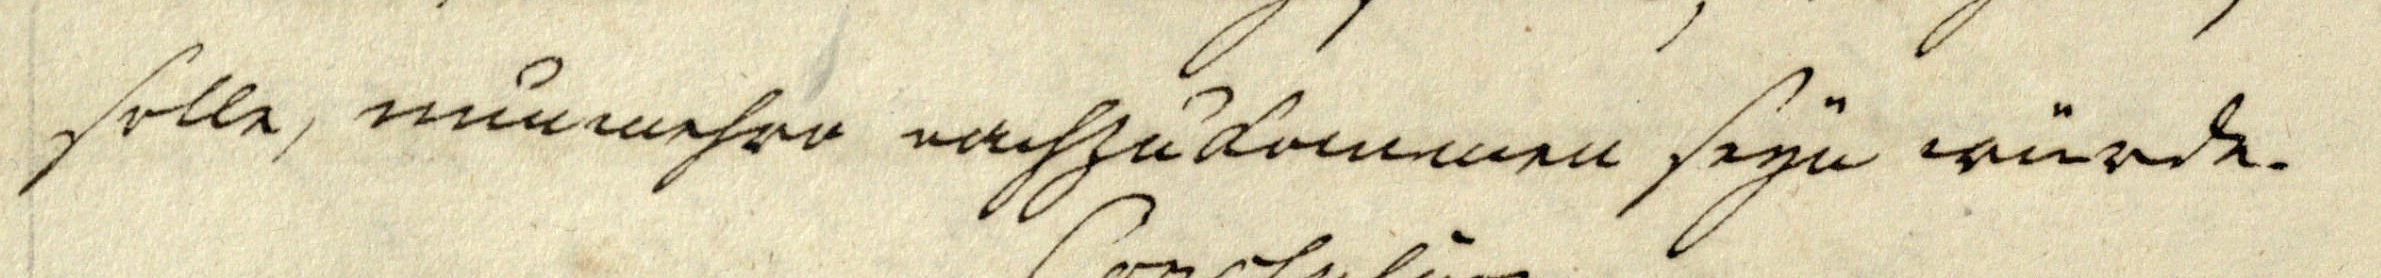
solle, nunmehro nachzukommen seÿn würde.
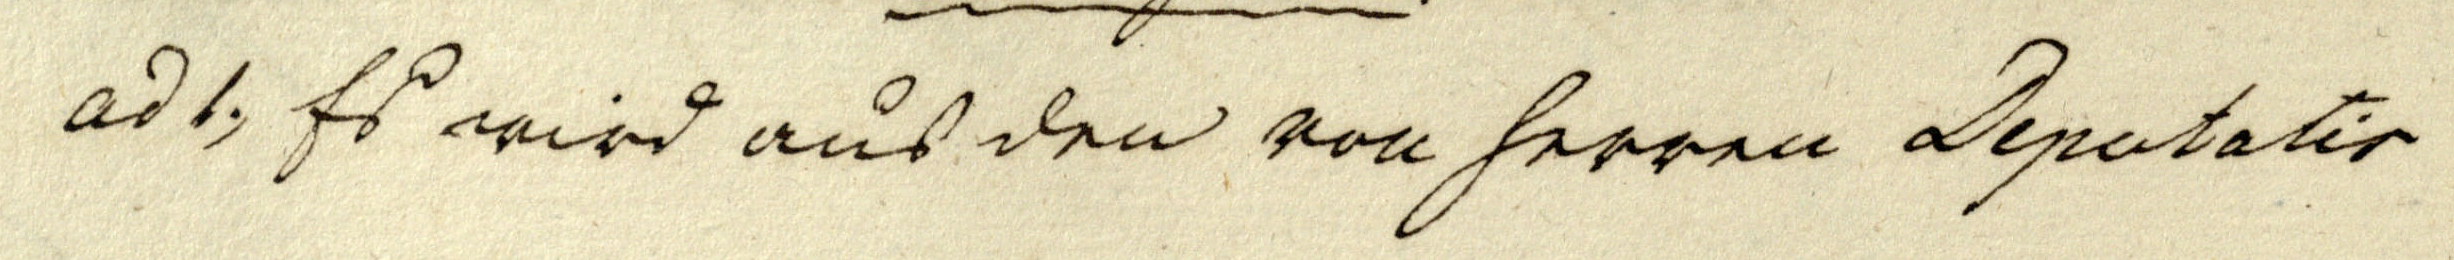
ad 1., Es wird aus den von Herren Deputatis
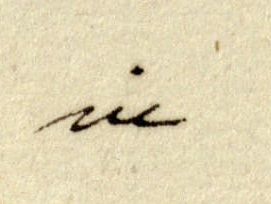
in
